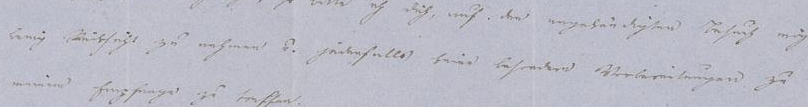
wenig Rücksicht zu nehmen u. jedenfalls keine besondern Vorbereitungen zu
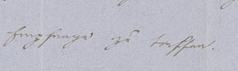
Empfange zu treffen.
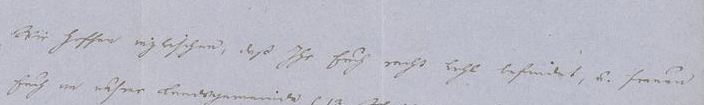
Wir hoffen inzwischen, daß Ihr Euch recht wohl befindet, u. freuen
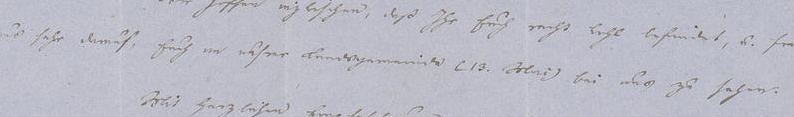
uns sehr darauf, Euch an unsrer Landsgemeinde ( 13. Mai) bei uns zu sehen.
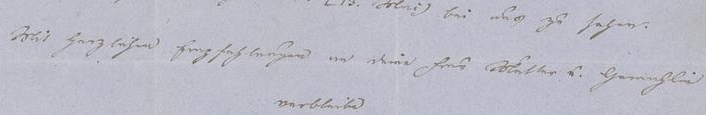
Mit herzlichen Empfehlungen an Deine Frau Mutter u. Gemahlin
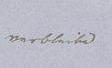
verbleibe
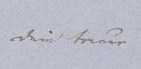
Dein treuer
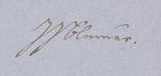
J J Blumer.
